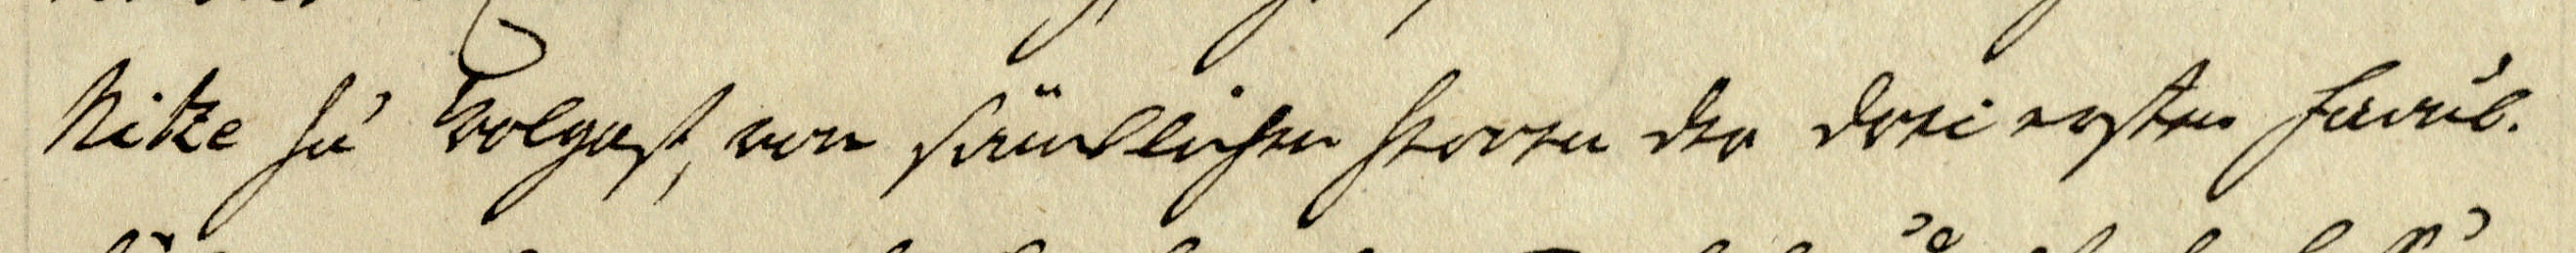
Nitze zu Wolgast, von sämtlichen Herren der drei ersten Facul¬
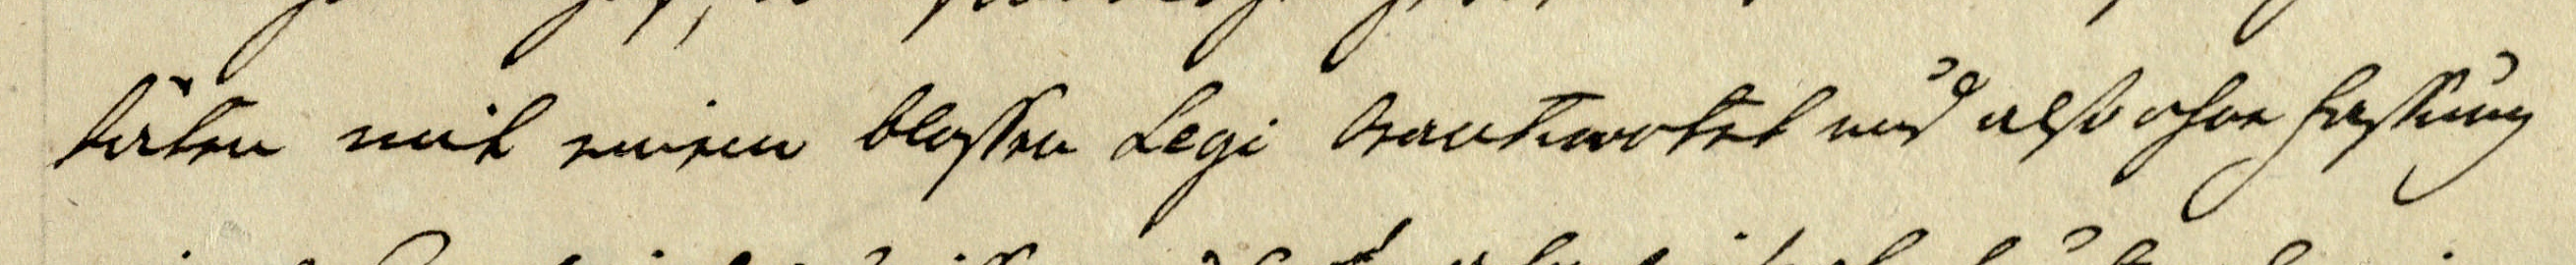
täten mit einem blossen Legi beantwortet und als ohne Fassung
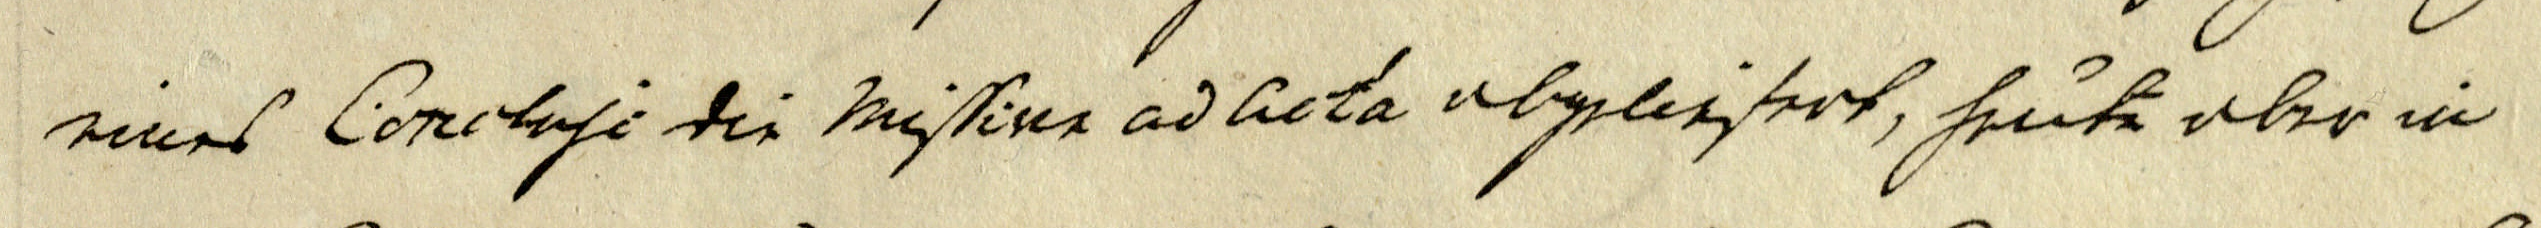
eines Conclusi die Missive ad Acta abgeliefert, heute aber in
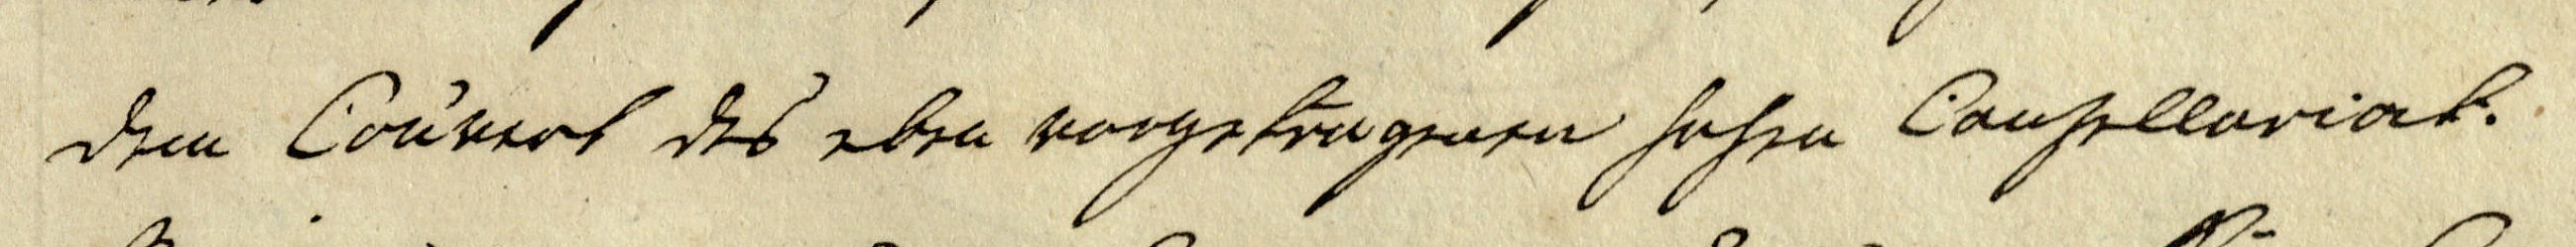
dem Couvert des eben vorgetragenen hohen Canzellariat-
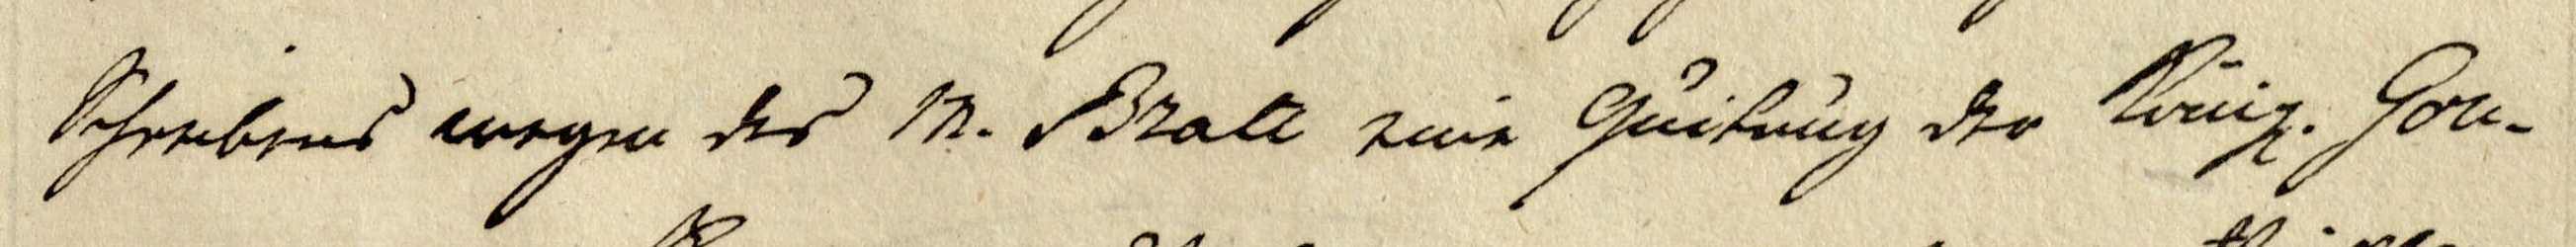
Schreibens wegen des M. Bratt eine Quitung der Königl. Gou¬
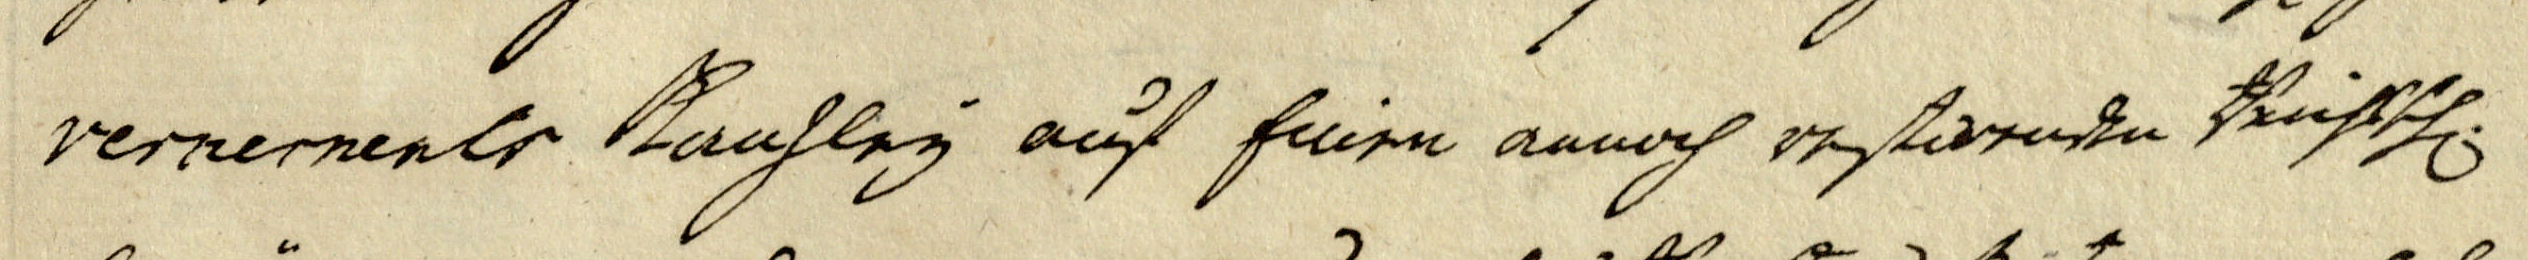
vernements Kanzleÿ auf Einen annoch restirenden Reichssl.
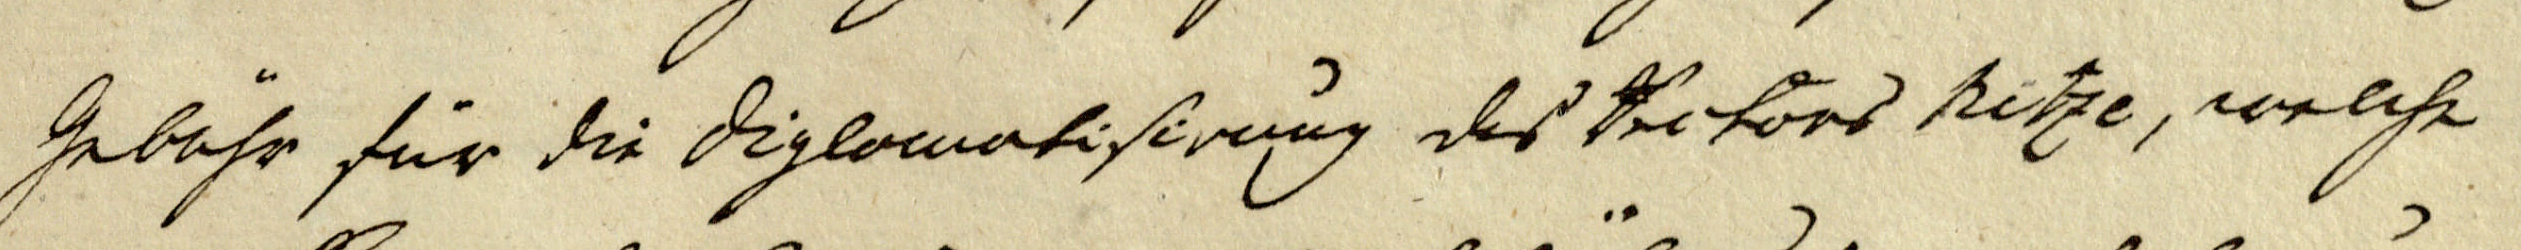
Gebühr für die Diplomatisirung des Rectors Nitze, welche
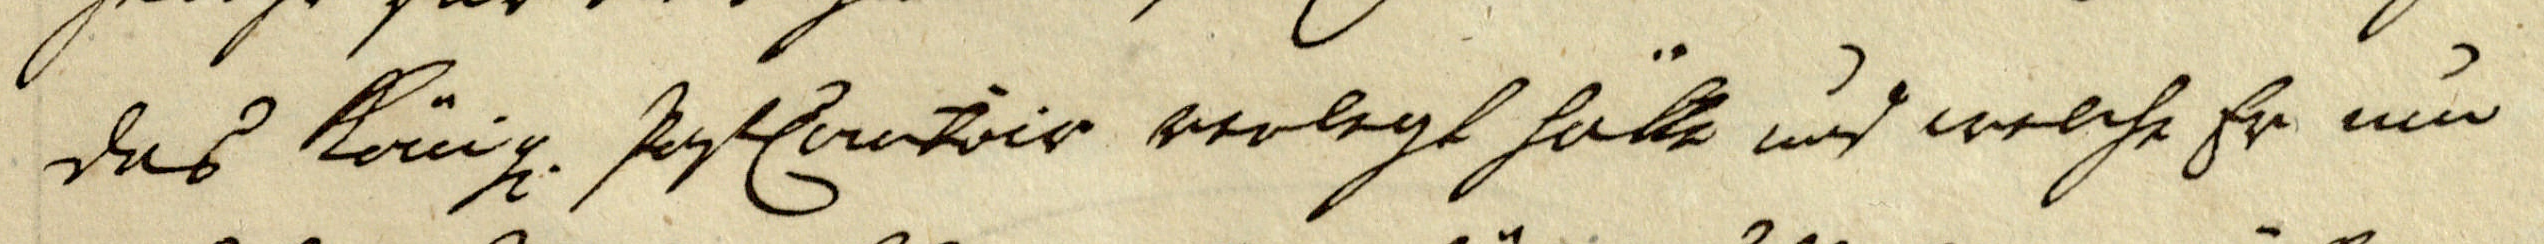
das König. PostContoir verlegt hätte und welche Er um
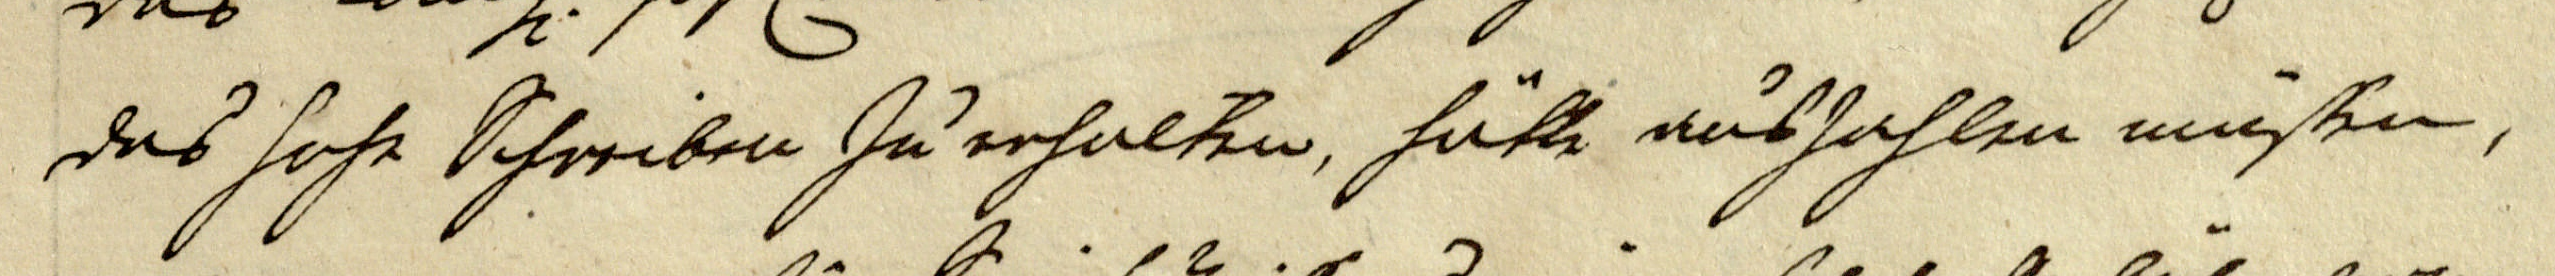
das hohe Schreiben zu erhalten, hätte auszahlen müssen,
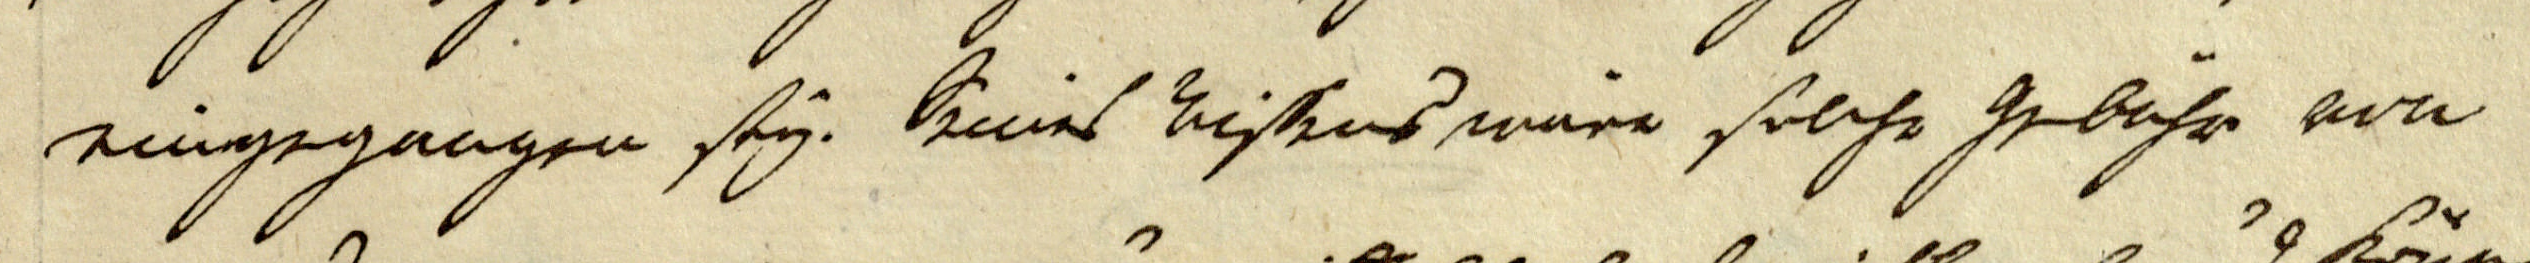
eingegangen seÿ. Seines Wissens wäre solche Gebühr von
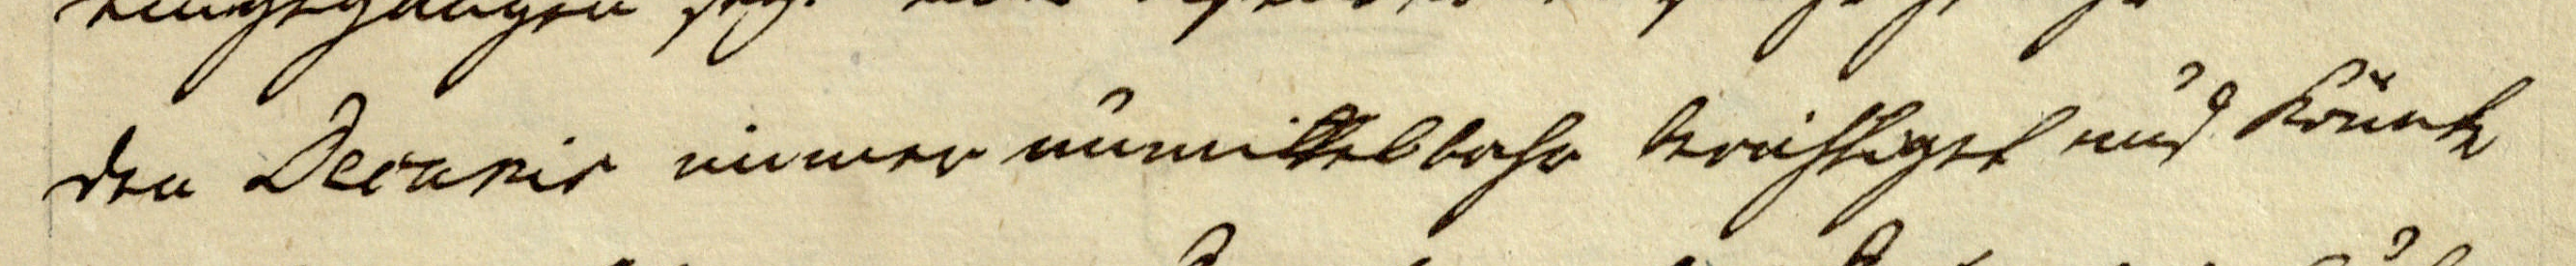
den Decanis immer unmittelbahr berichtiget und könnte
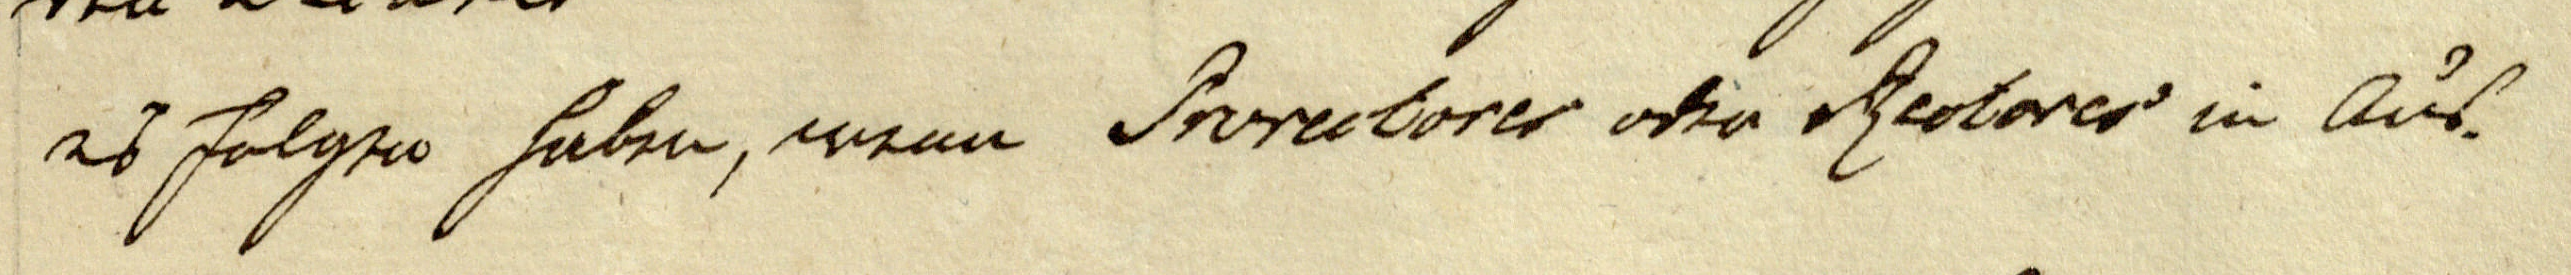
es Folgen haben, wenn Prorectores oder Rectores in Aus¬
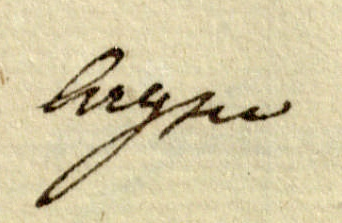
lagen
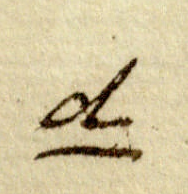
d
